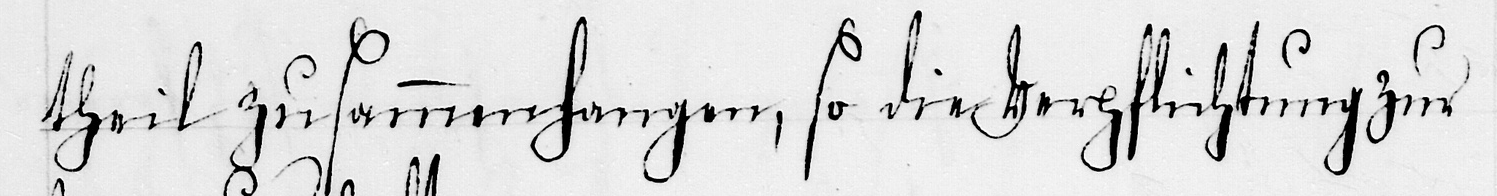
theil zusammenhangen, so die Verpflichtung zur
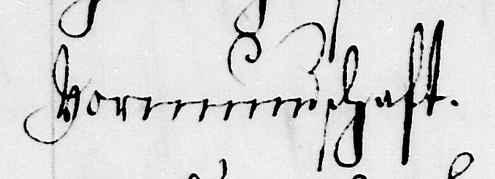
Vormundschaft.
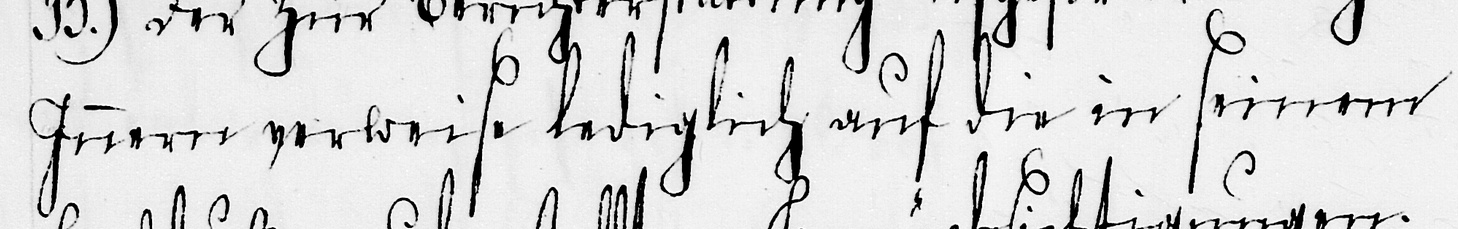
Innern verweise lediglich auf die in seinem
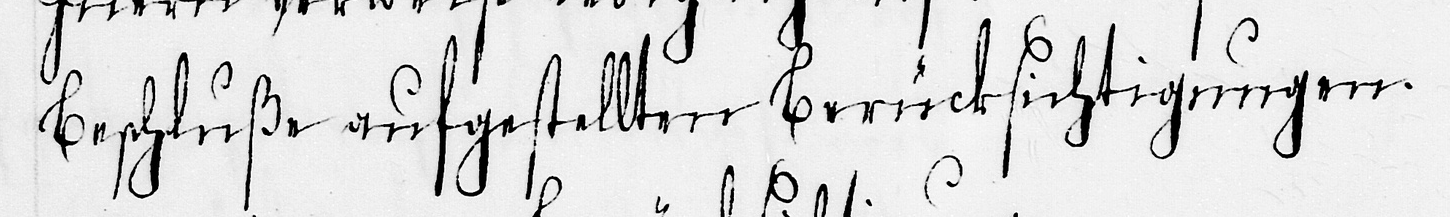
Beschluße aufgestellten Berücksichtigungen.
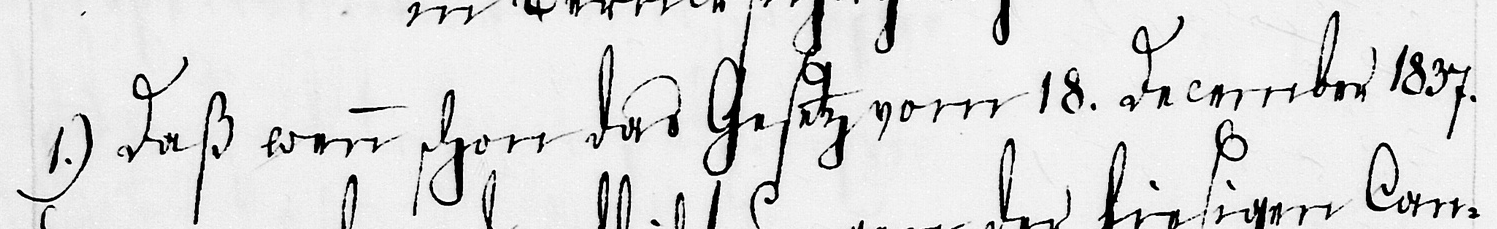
1.) Daß wenn schon das Gesetz vom 18. December 1837.
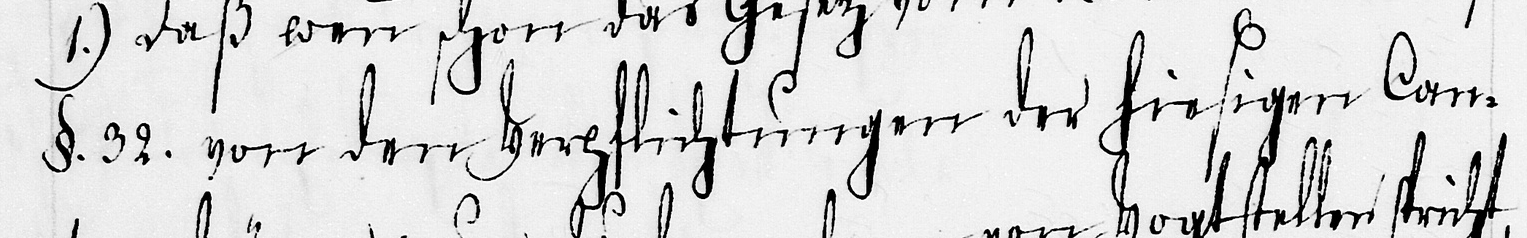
§. 32. von den Verpflichtungen der hiesigen Can¬
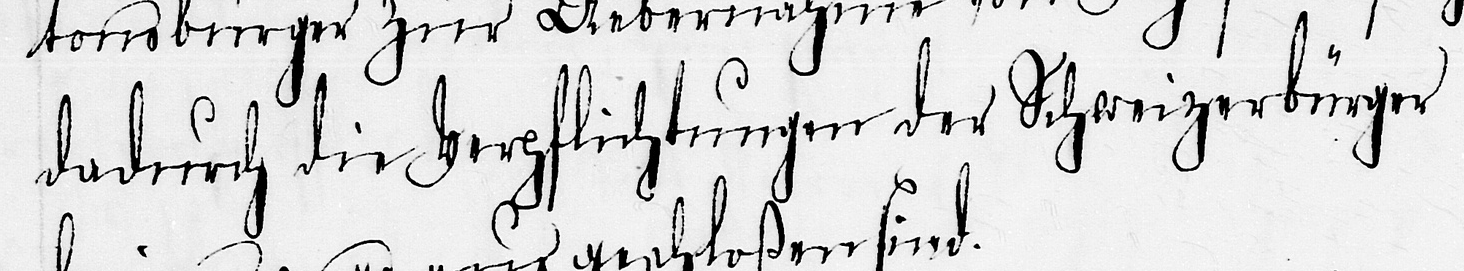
dadurch die Verpflichtungen der Schweizerbürger
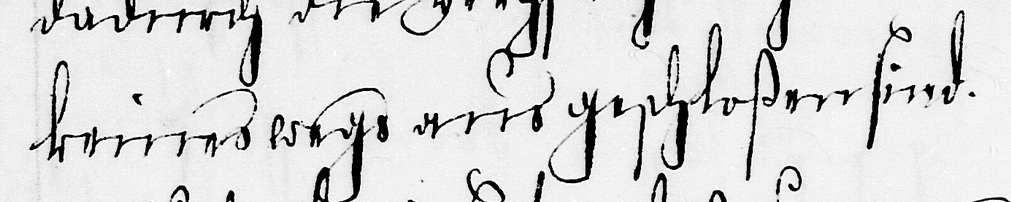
keineswegs ausgeschloßen sind.
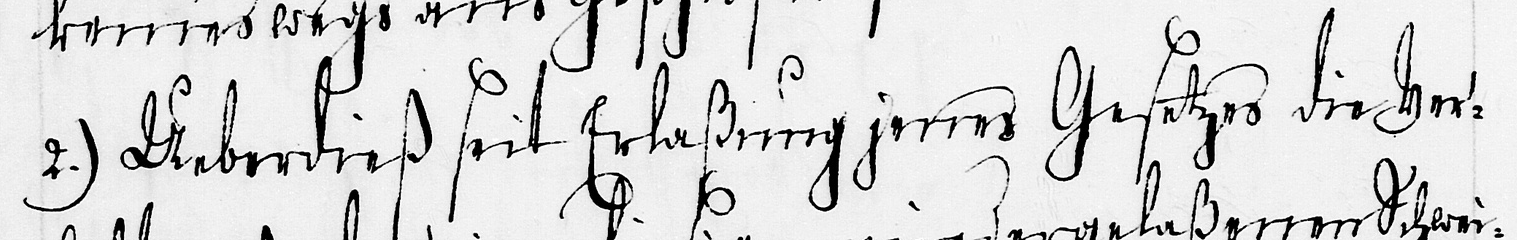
2.) Ueberdieß seit Erlaßung jenes Gesetzes die Ver¬
